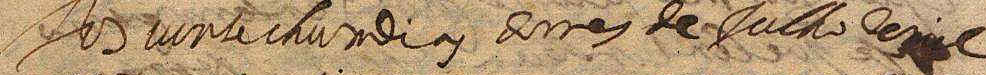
Aos uinte e hum dias do mes de julho de mil
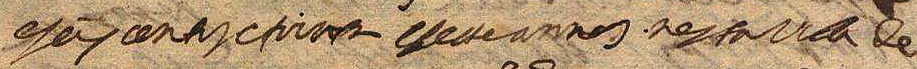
e seiscentos e trinta e sette annos nesta villa de
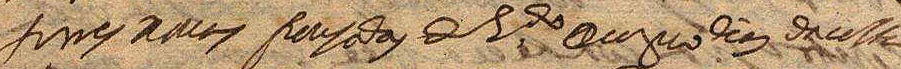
torres nouas pousadas do l.do Dioguo dias da costa
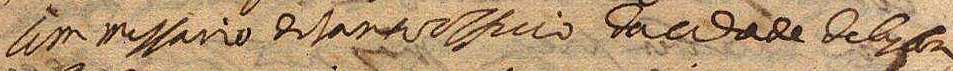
commissario do santo officio da cidade de lisboa
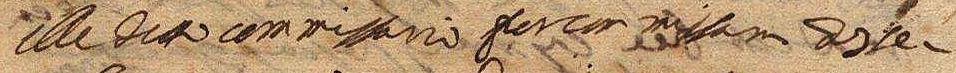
elle ditto commissario por comissam dos se
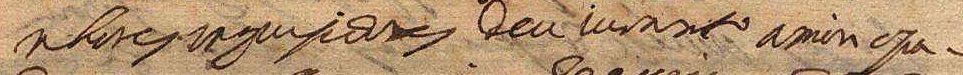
nhores inquisidores deu iuramto a min o pa
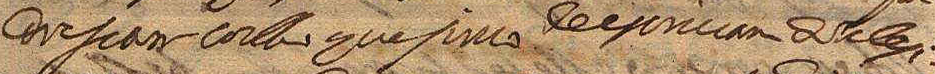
dre joam coelho que siruo de escriuam do eclesi
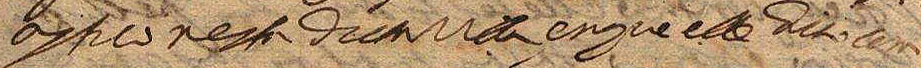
astico nesta ditta villa, en que elle dito com
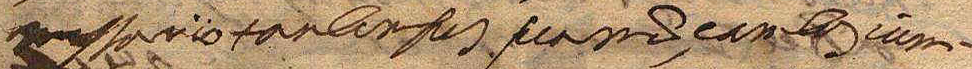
missario tanbem pos sua mão, e ambos iura
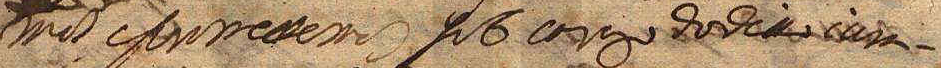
mos e promettemos sob cargo do ditto iura
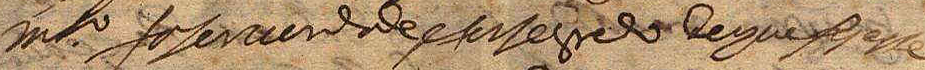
mt.o fazer uerdade e ter segredo de que fis este
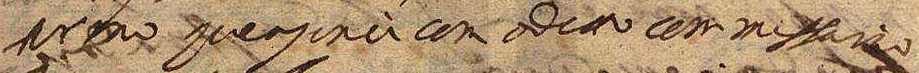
termo que asinei com o ditto commissario
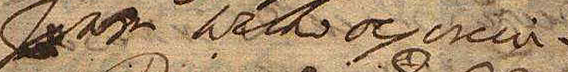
Joam coelho o escreui.
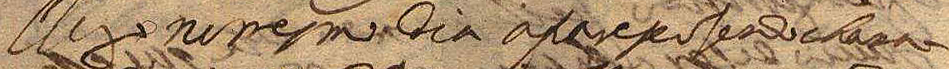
E logo no mesmo dia apareseo sendo chama
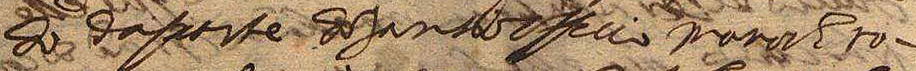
do da parte do santo officio manoel ro
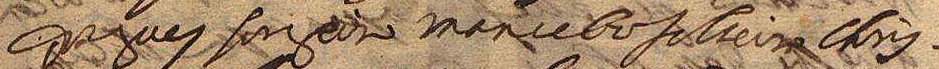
drigues sirgeiro mancebo solteiro chris
